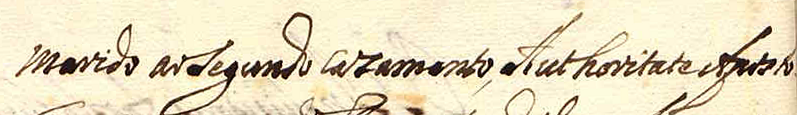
marido ao segundo cazamento Authoritate Aposto
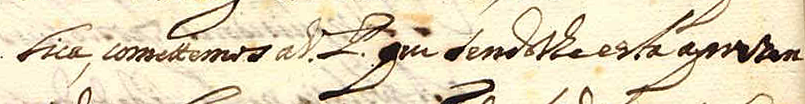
lica, comettemos a V. P. que sendo lhe esta aprezen
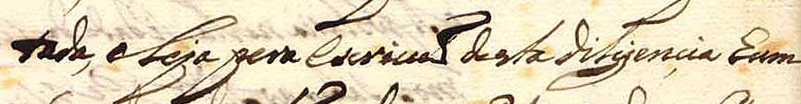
tada, eleja pera escriuaõ desta diligencia hum
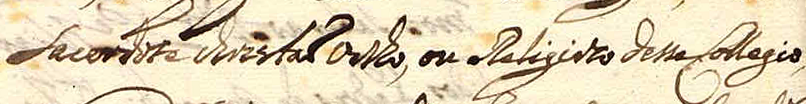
sacerdote christaõ velho, ou Religiozo desse Collegio,
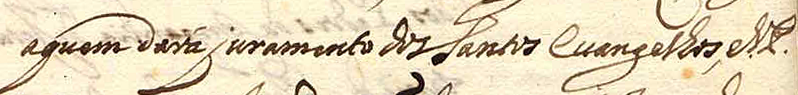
a quem dará juramento dos Santos Euangelhos, e V. P.
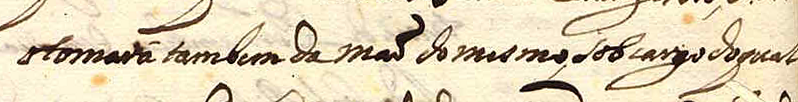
o tomará tambem da maõ do mesmo, sob cargo do qual
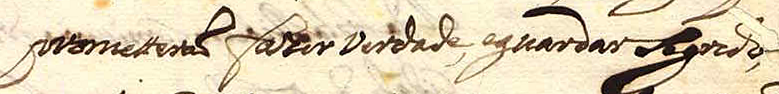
prometteraõ fazer verdade, e guardar segredo,
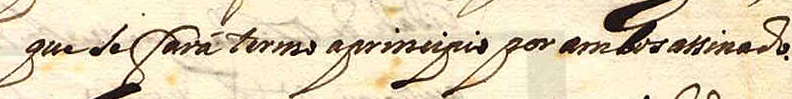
que se fará termo a principio por ambos assinado.
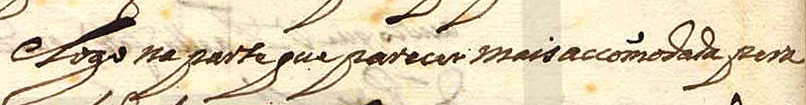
e Logo na parte que parecer mais accom̄odada pera
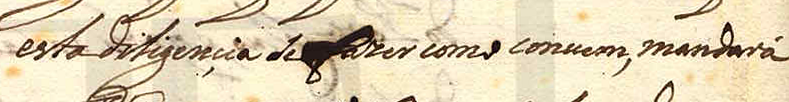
esta diligencia se fazer como conuem, mandará
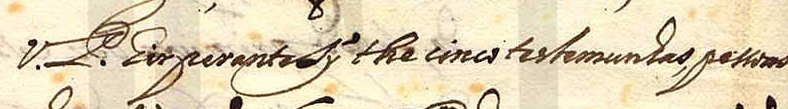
V. P. hir perante sy the cinco testemunhas, pessoas
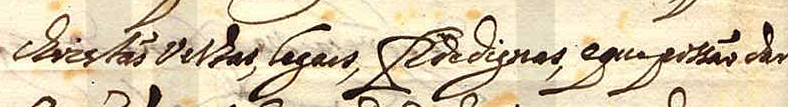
christãs velhas, legaes, fidedignas, e que possaõ dar
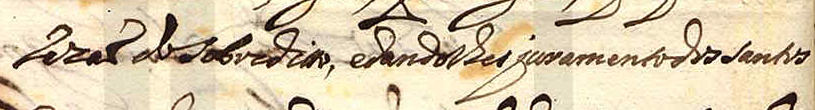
Rezaõ do sobreditto, e dandolhes juramento dos santos
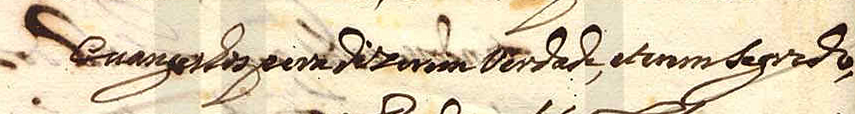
Euangelhos pera dizerem verdade, e terem segredo,
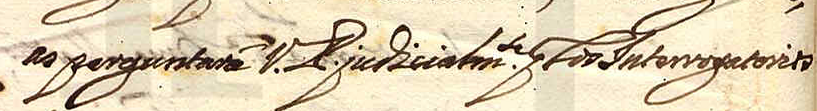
as perguntará V. P. judicialm.te p̄los Interrogatorios
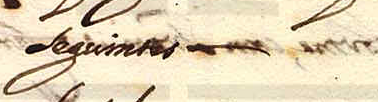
seguintes.
